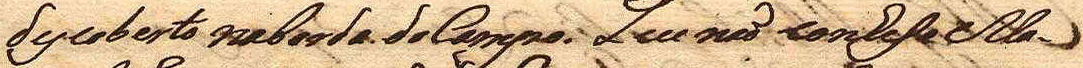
descoberto na borda do Campo. Que naõ conhese Ma
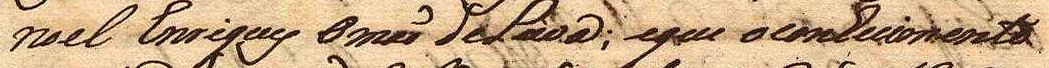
noel Enriques o maõ de Lava; e que o conhecimento
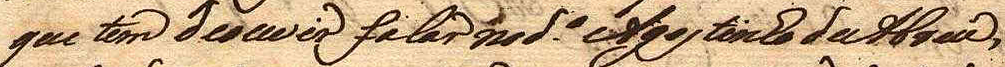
que tem de ouvir falar no d.o Agostinho de Abreu,
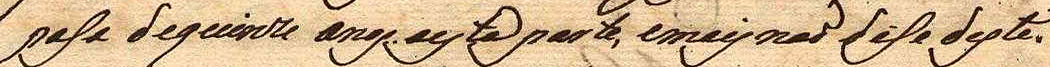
pasa de quinze anos, a esta parte, e mais naõ dise deste.
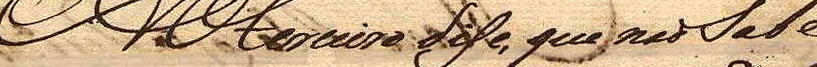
AO terceiro dise, que naõ Sabe
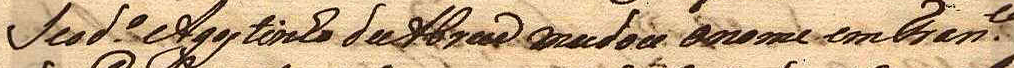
se o d.o Agostinho de Abreu mudou o nome em Fran.co
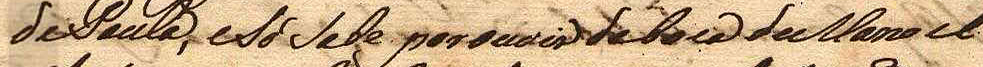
de Paula, e Só sabe por ouvir de boca de Manoel
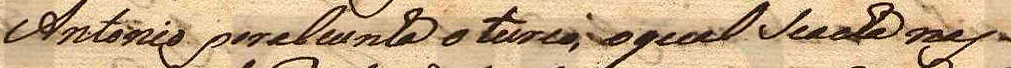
Antonio por alcunha o turco; o qual se acha nas
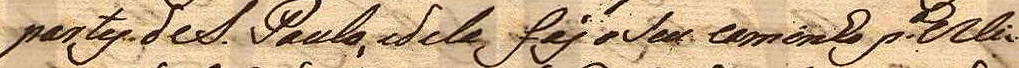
partes de S. Paulo, e dela foi o seu caminho p.a Mi
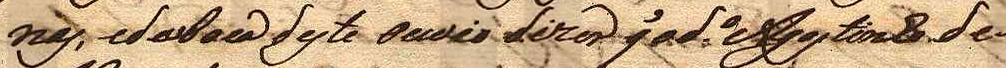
nas, e da boca deste ouvio dizer q̄ o d.o Agostinho de
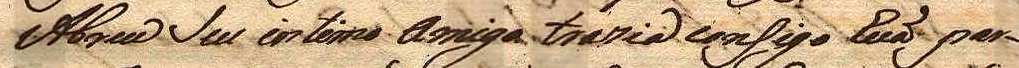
Abreu seu intimo amigo trazia consigo huā par
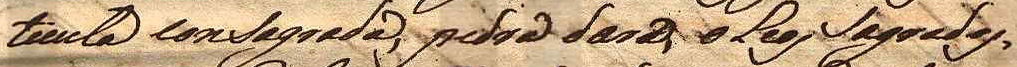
ticula consagrada, pedra dara, oLeos sagrados,
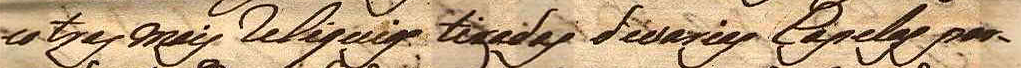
e o tres mais Reliquias tiradas de varias Capelas por
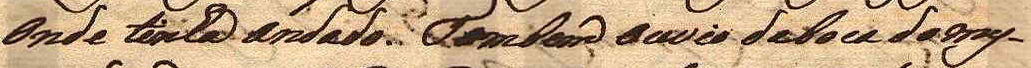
onde tinha andado. Tambem ouvio da boca do mes
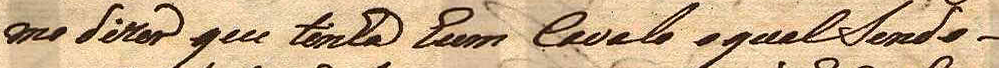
mo dizer que tinha hum Cavalo o qual Sendo
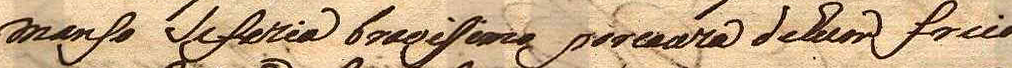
manso se fazia bravisimo por cauza de hum freio
